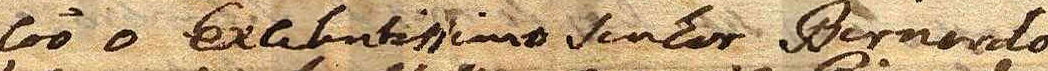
çaõ o Excelentissimo senhor Bernardo
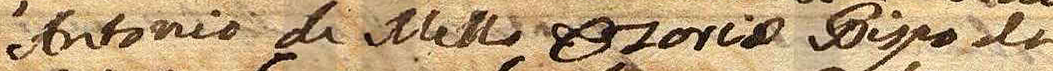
Antonio de Mello Ozorio Bispo da
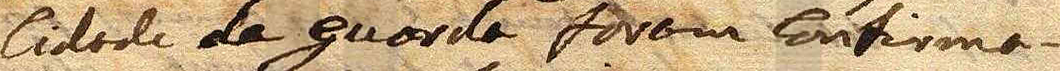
Cidade da Guarda foram Confirma
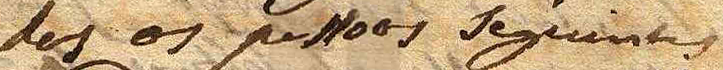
das as pessoas seguintes.
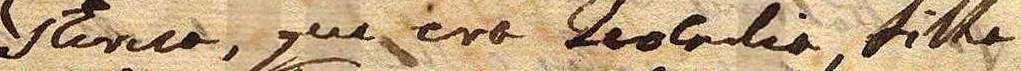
Thereza, que era Leocadia, filha
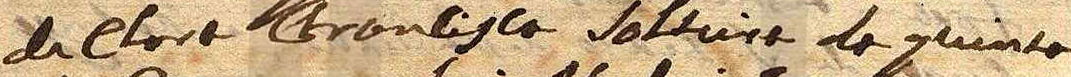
de Clara Francisca solteira da quinta
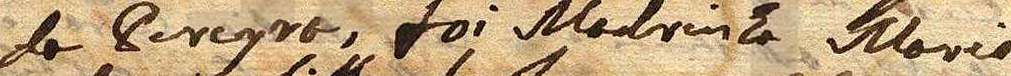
da Pereyra, foi Madrinha Maria
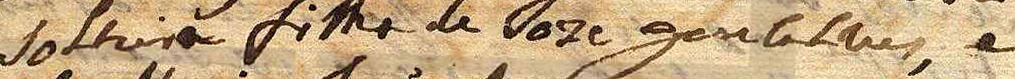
solteira filha de Ioze goncalves, e
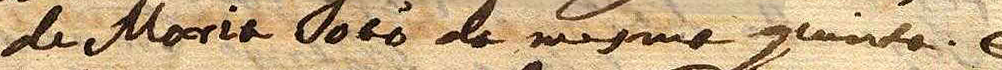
de Maria Ioaõ da mesma quinta. e
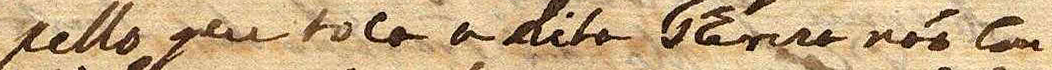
pello que toca a dita Thereza não Con
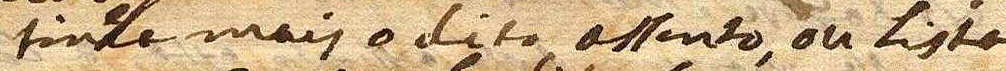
tinha mais o dito assento, ou Lista
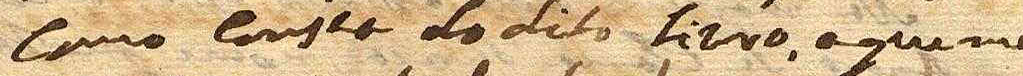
Como Consta do dito Livro, a que me
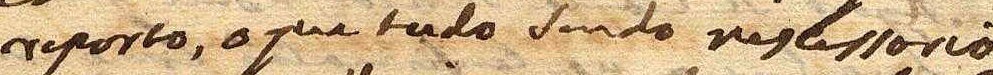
reporto, o que tudo sendo nescessario
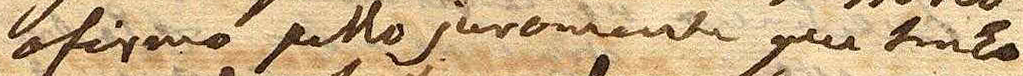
afirmo pello juramento que tenho
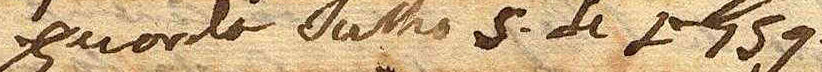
Guarda Iulho 5. de 1759.
